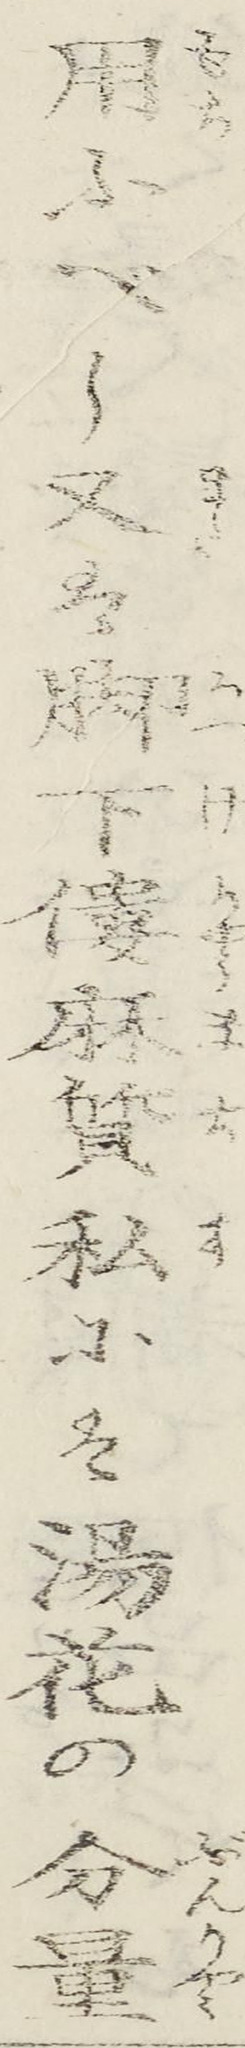用ふべし又は脚気僂麻質私には湯花の分量
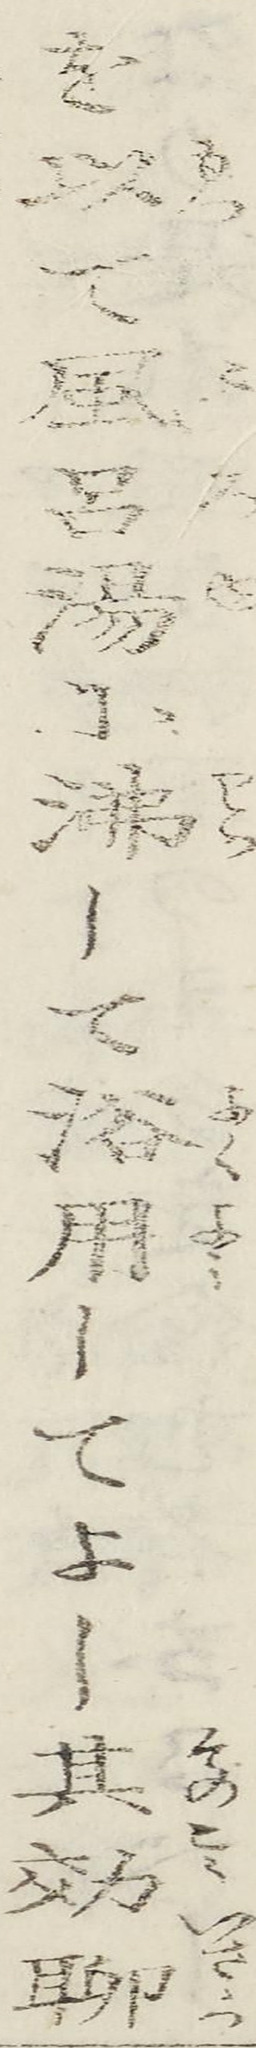を以て風呂湯に沸して浴用にしてよし其効聊
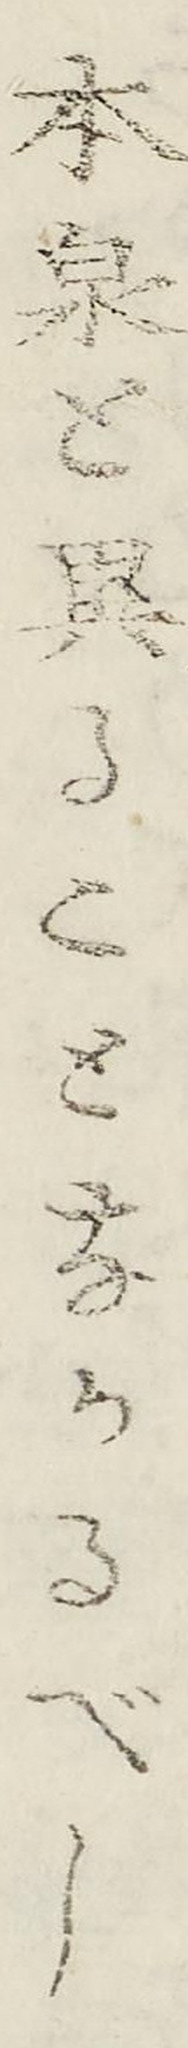本泉と異ることなかるべし

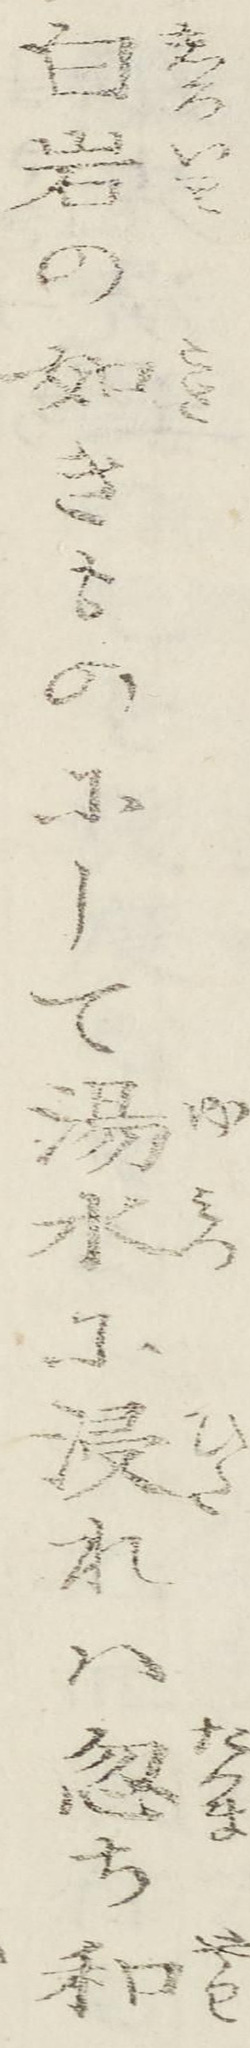白岩の如きものにして湯水に浸れは忽ち和
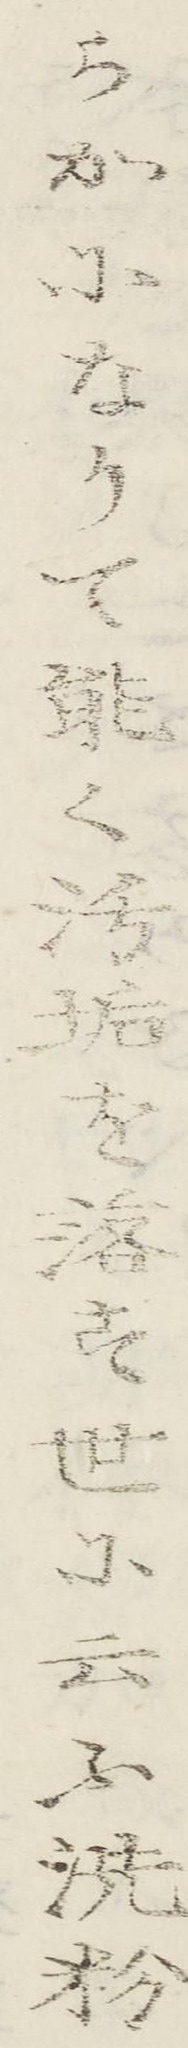らかになりて能く汚垢を落す世に云ふ洗粉
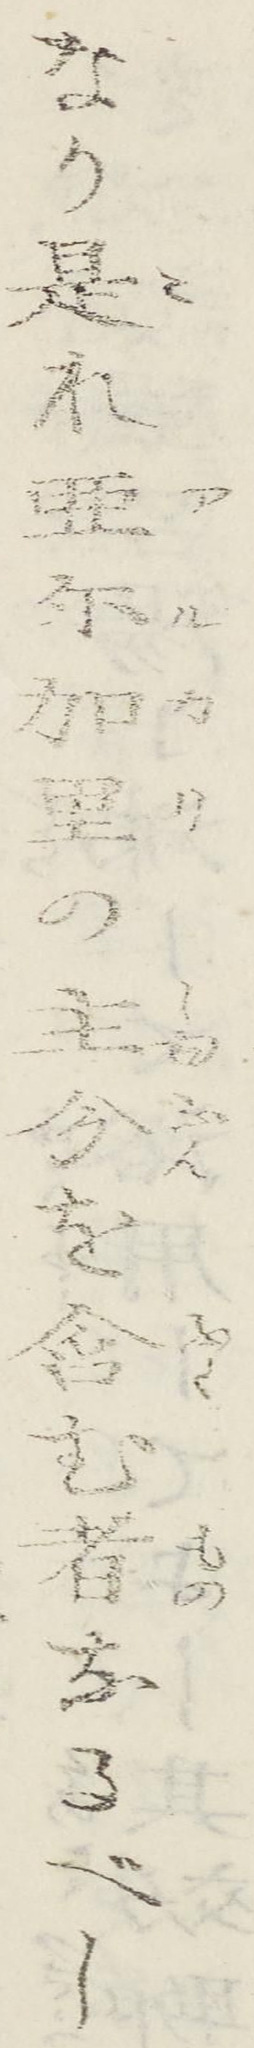なり是れ亜尓加里の主分を含む者なるべし
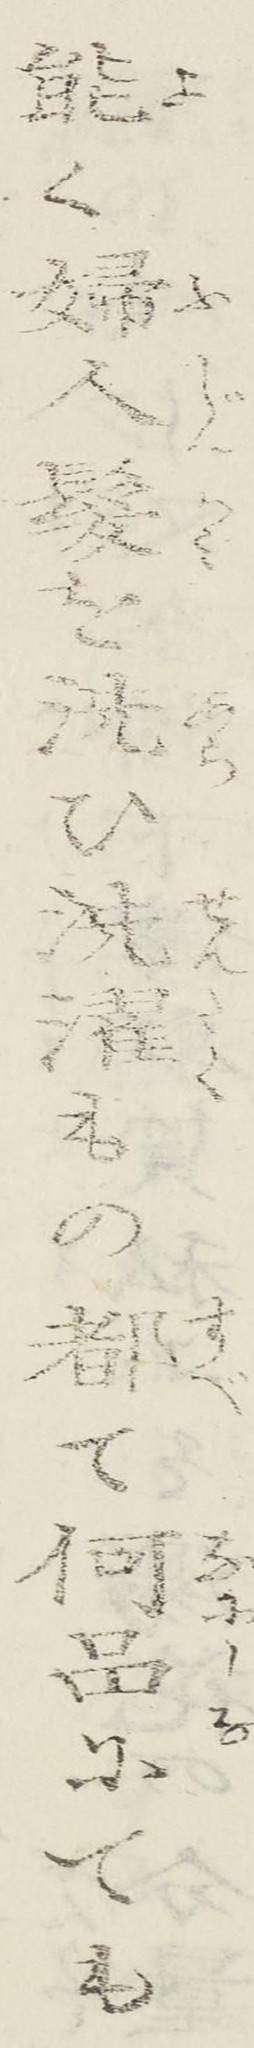能く婦人髪を洗ひ洗濯もの都て何品にても
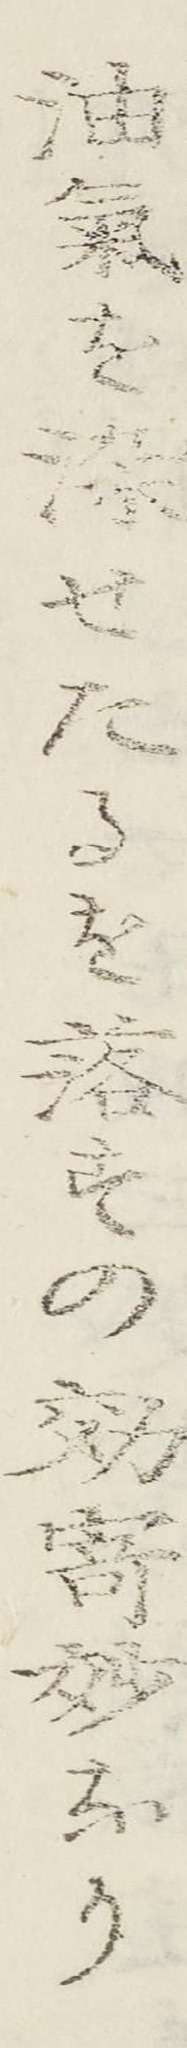油気を染せたるを落すの効寄妙なり
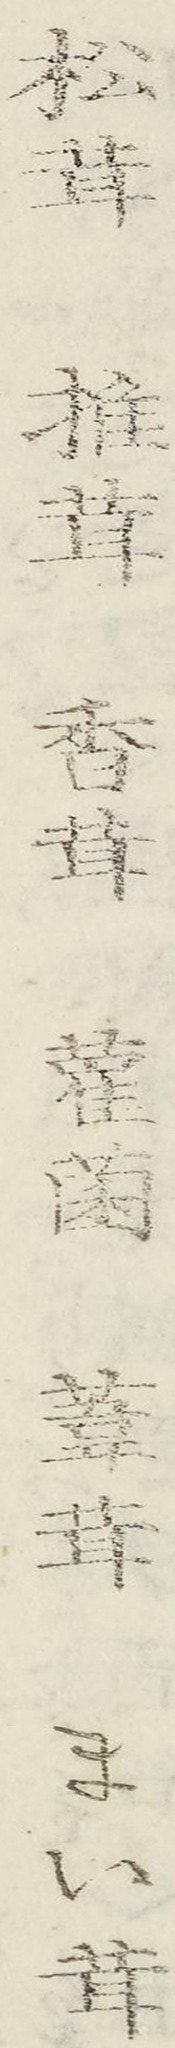松茸椎茸香茸雚菌葦茸まい茸
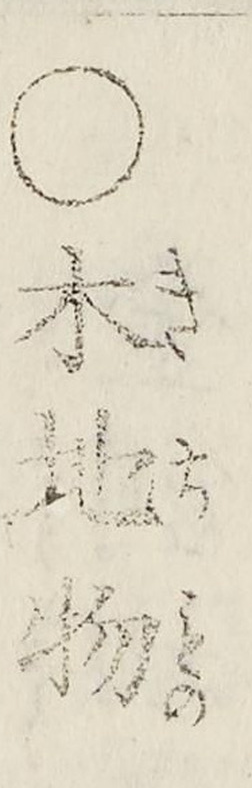○木地物
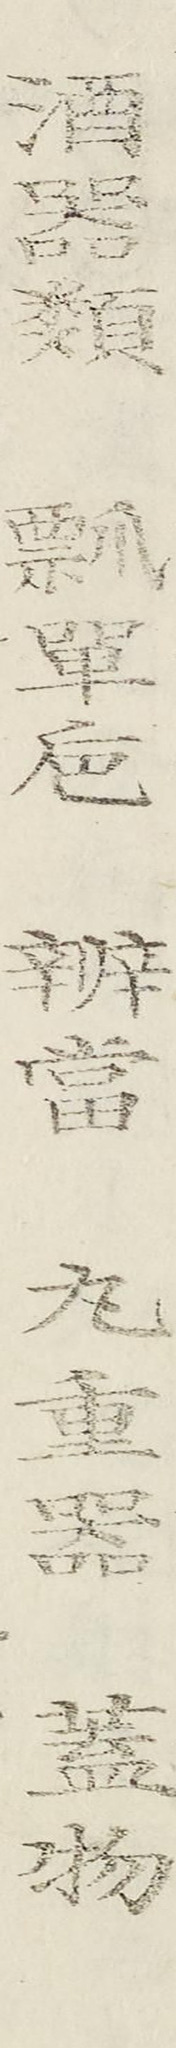酒器類瓢単巵弁当丸重器蓋物
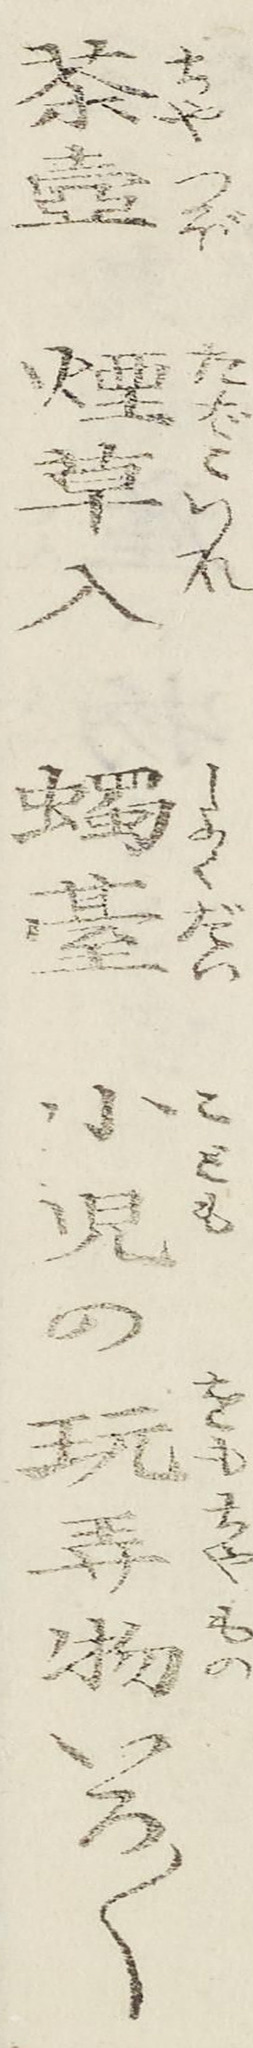茶壷煙草入燭台小児の玩弄物いろ〳〵
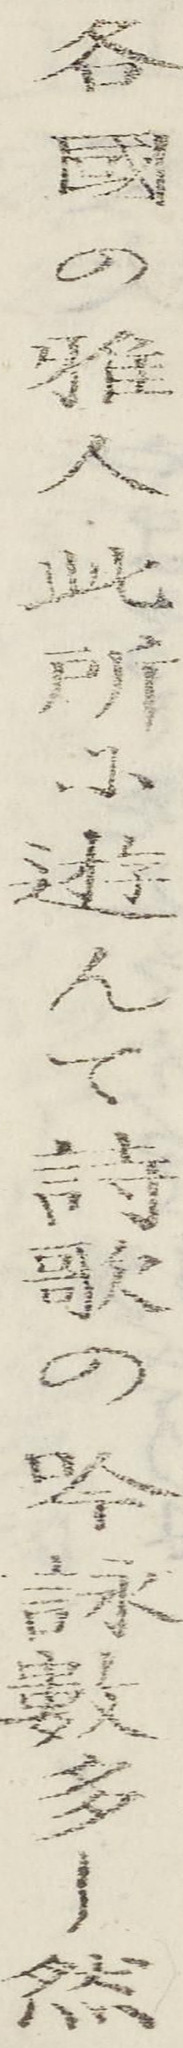各国の雅人此所に遊んで詩歌の吟詠数多し然
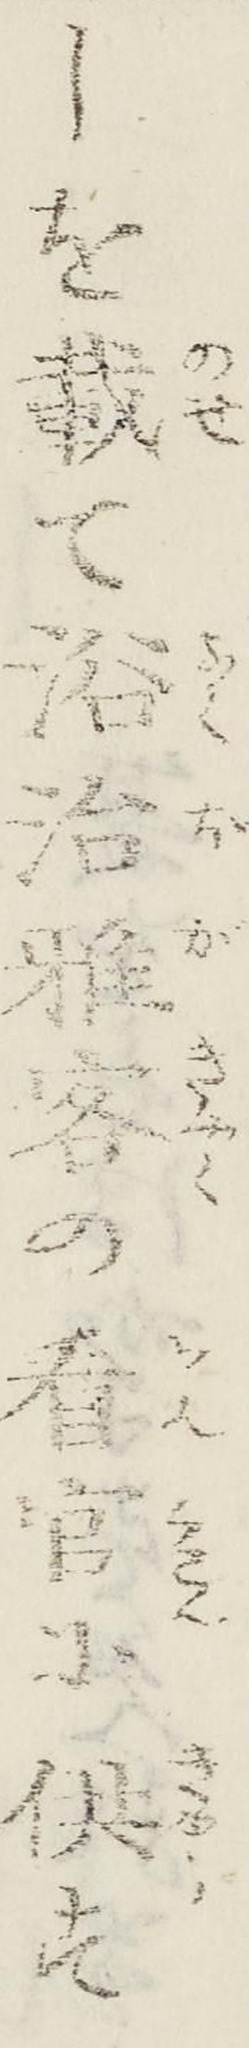しを載て浴治雅客の看官に供す
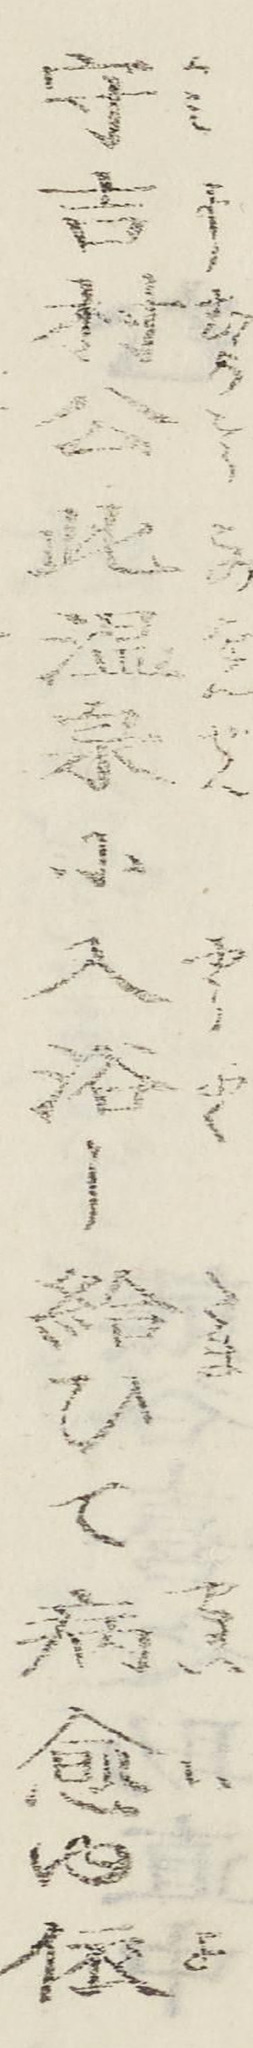守吉村公此温泉に入浴し給ひて病愈ゆ依
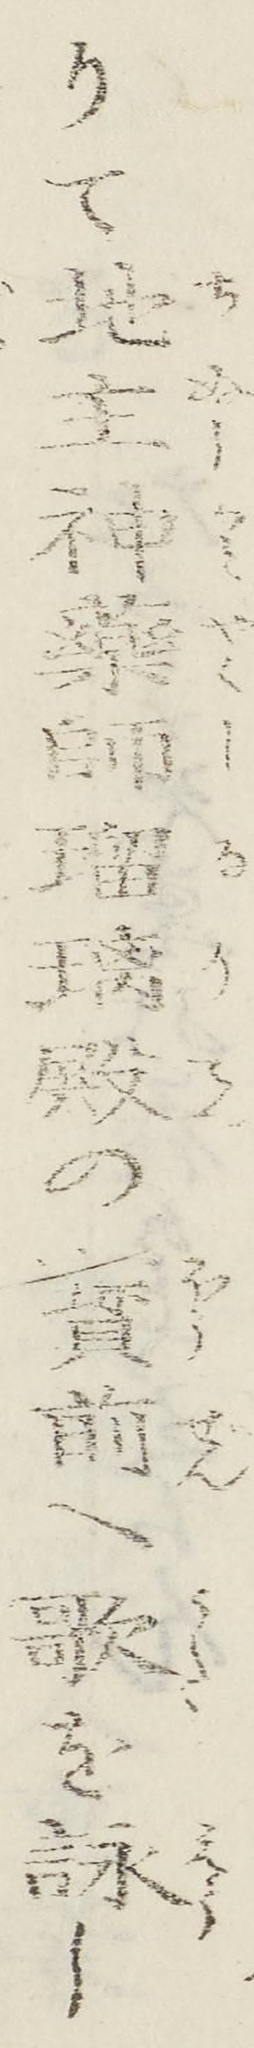りて地主神薬師瑠璃殿の宝前へ歌を詠し
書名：鎌先温泉由來記
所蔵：東京大学地震研究所図書室 Earthquake Research Institute Library, The University of Tokyo, JAPAN
